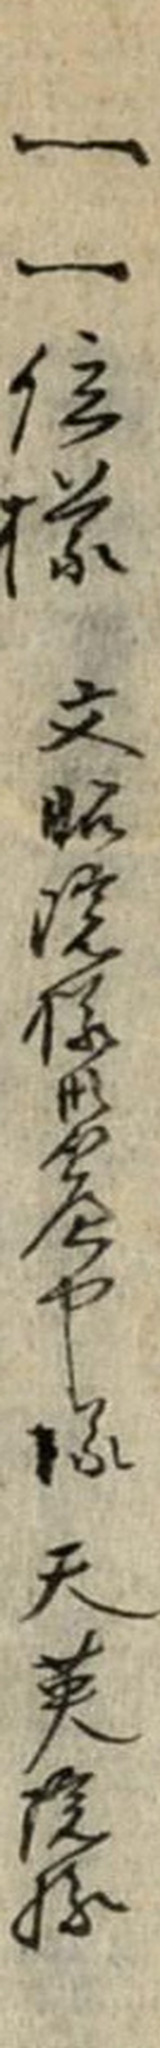一一位様文昭院様御簾中様天英院様
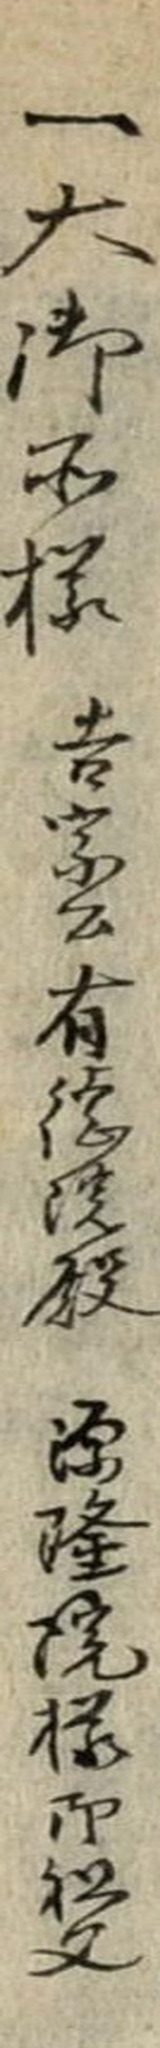一大御所様吉宗公有徳院殿源隆院様御祖父
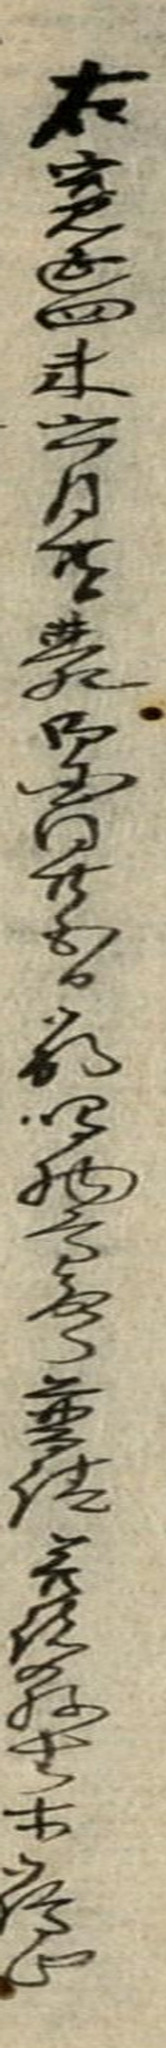右寛延四未六月廿日薨御国同廿五日御触鳴物高声普請并諸殺生等御停止
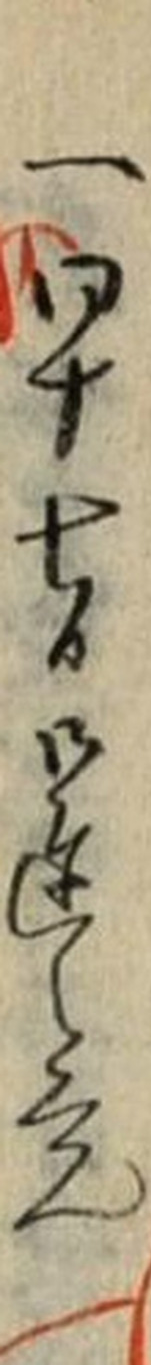一同十七日口達之覚
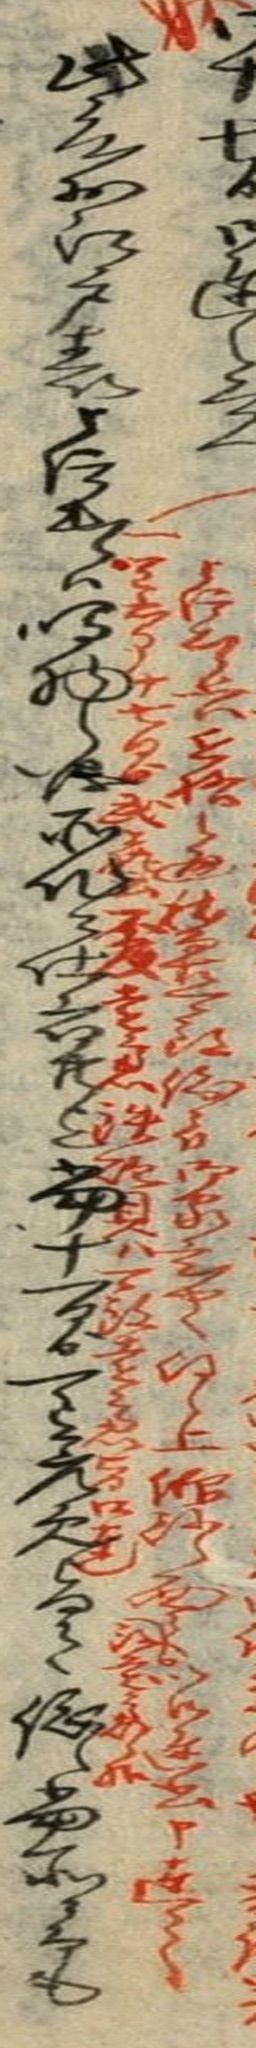此度於江戸表被仰出候は鳴物之儀所作に仕者共迄当十一日ゟ可被差免旨に候依之当所にても
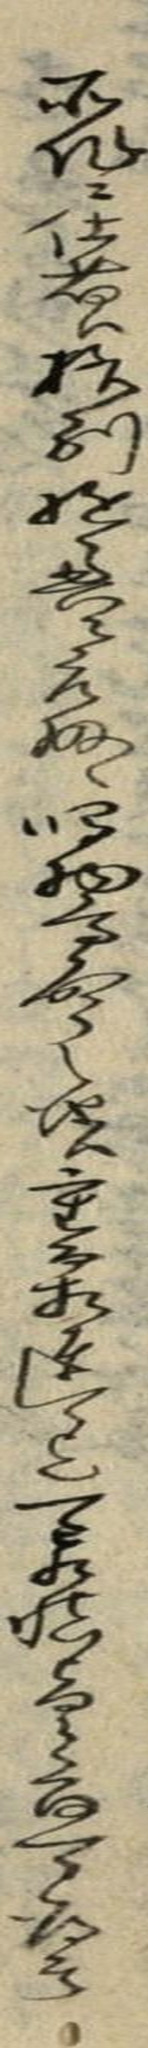所作に仕者は格別遊興に取扱候鳴物高声之儀は重て相達候迄可被相慎旨に候間可被得其
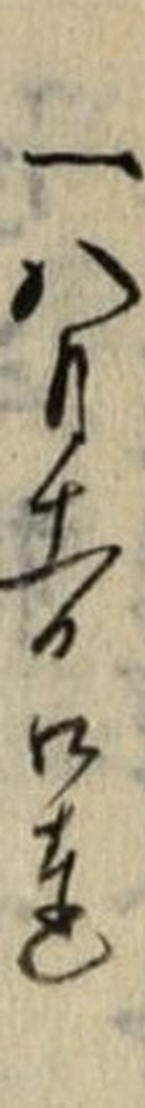一八月十一日口達
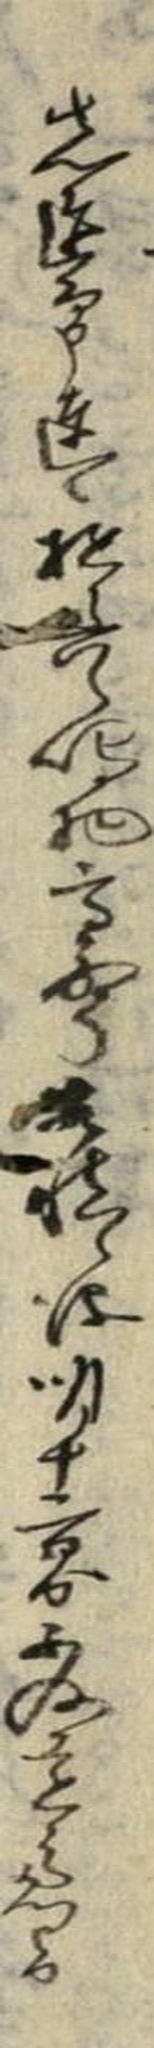先達て申達候遊興之鳴物高声相慎候儀明十二日ゟ不及遠慮旨
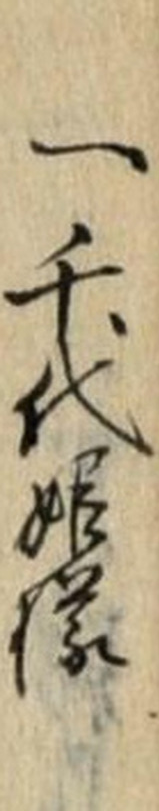一千代姫様
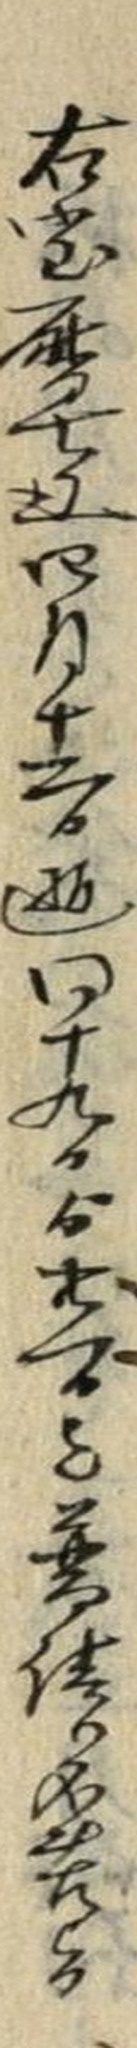右宝暦七丑四月十二日逝同十九日ゟ廿一日迄普請は不苦旨
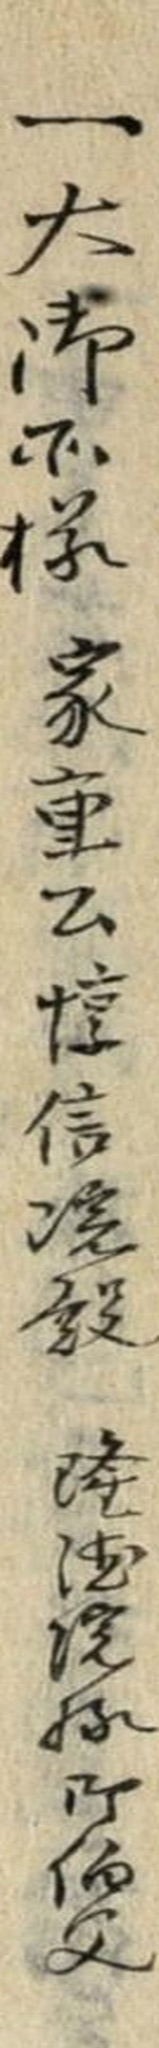一大御所様家重公惇信院殿隆徳院様御伯父
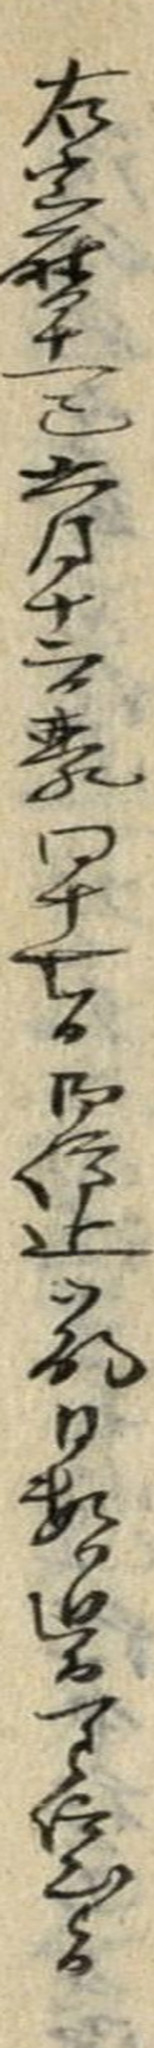右宝暦十一巳六月十二日薨同十七日御停止御触日数は追て可被仰出旨
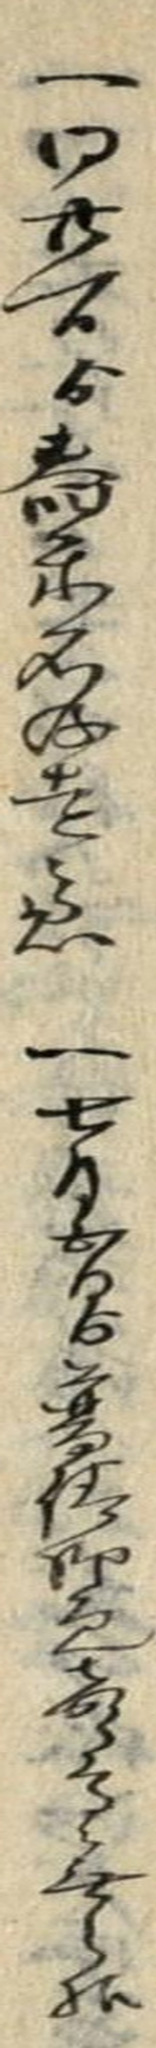一同廿一日ゟ舂米不及遠慮一七月五日ゟ普請御免声高に無之様
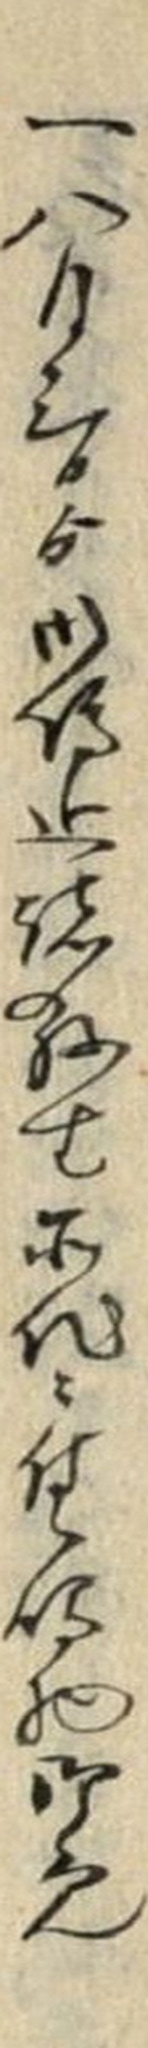一八月三日ゟ御停止諸殺生所作に付候鳴物御免
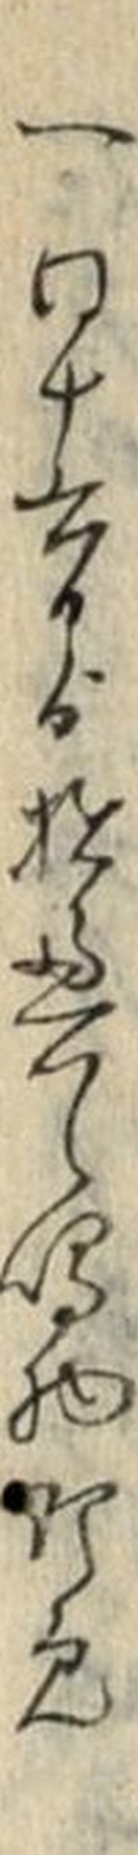一同十六日ゟ遊興之鳴物御免
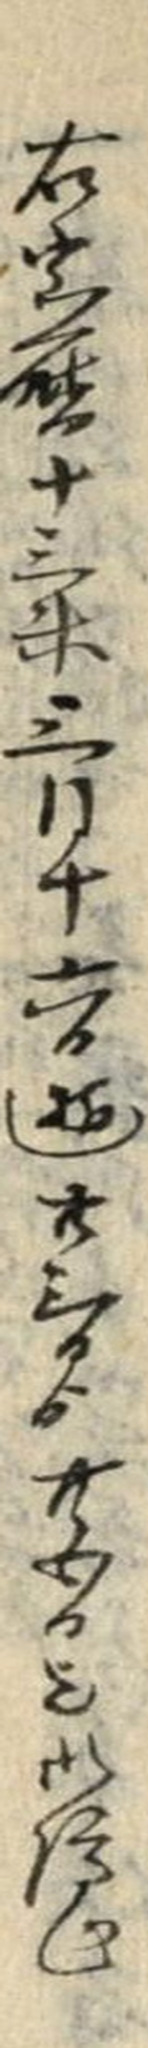右宝暦十三未三月十六日逝廿三日ゟ廿五日迄御停止
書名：御停止異変死失
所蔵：福井県文書館 Fukui Prefectural Archives
